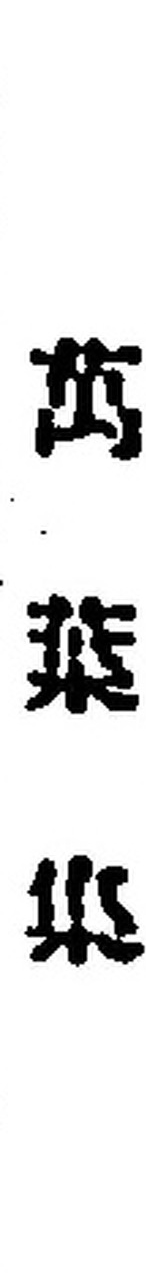万葉集
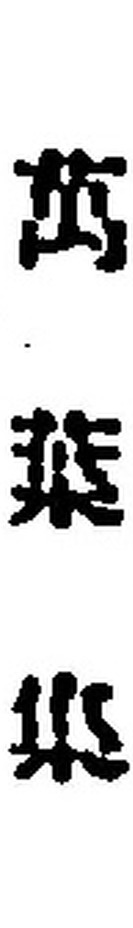万葉集
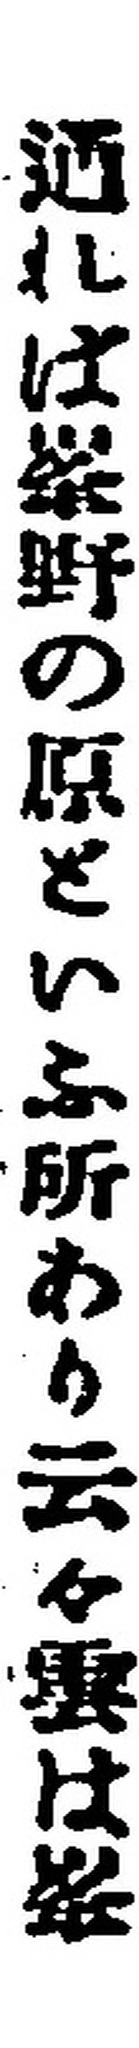通れば峯野の原といふ所あり云々雲は峯
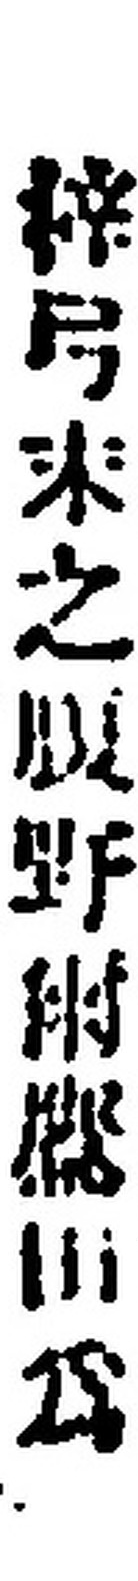梓弓末之腹野爾鷹田為
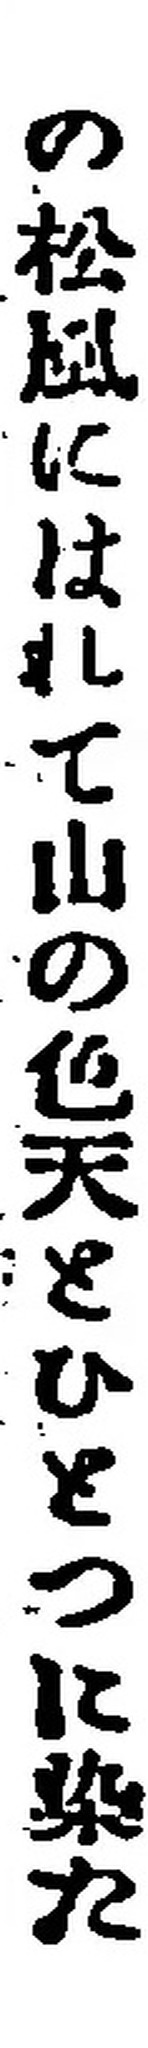の松風にはれて山の色天とひとつに染た
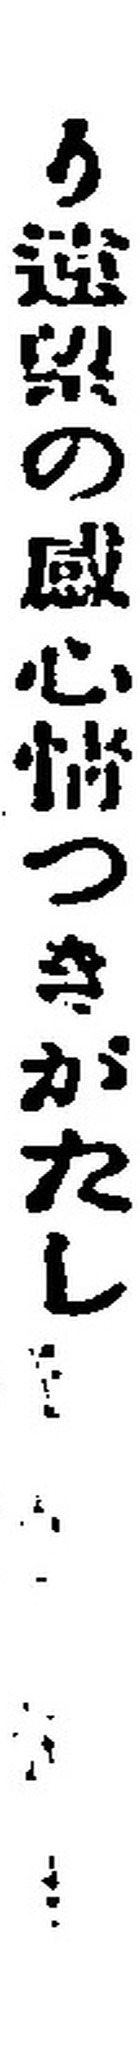り遠望の感心情つきがたし
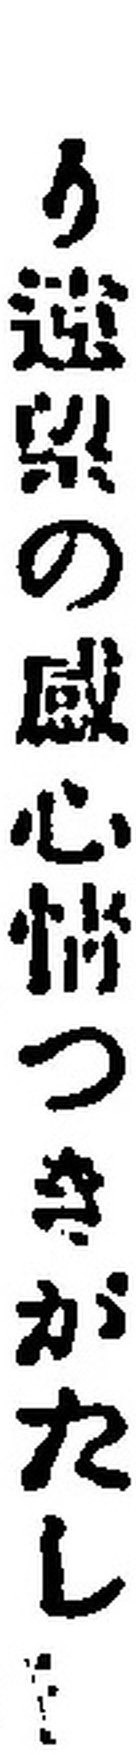り遠望の感心情つきがたし
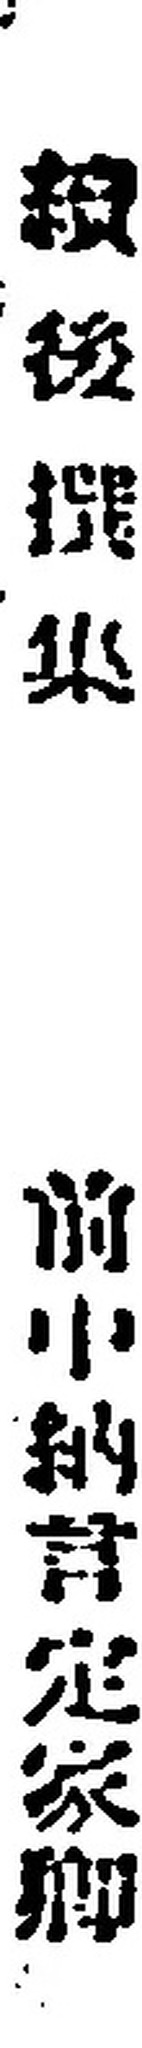続後撰集前中納言定家卿
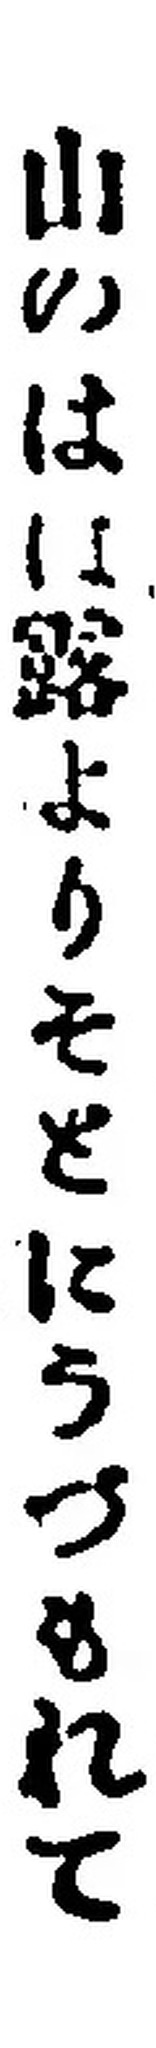山のはは露よりそとにうづもれて
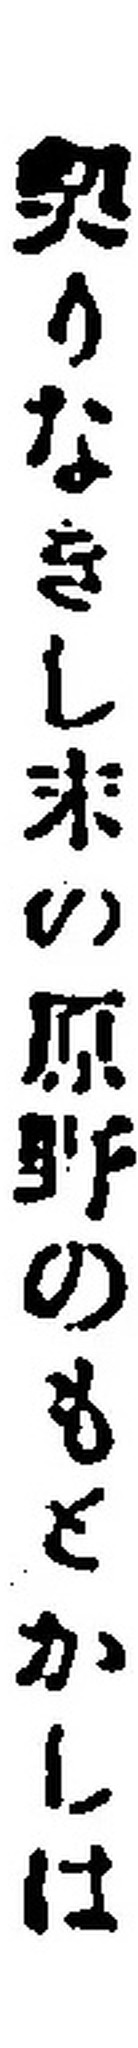契りなきし末の原野のもとかしは
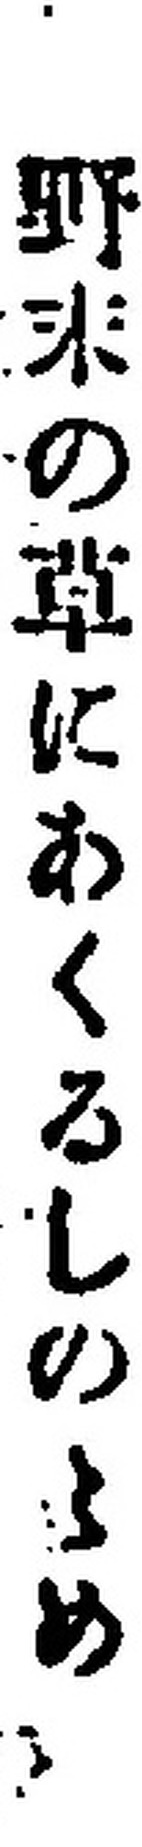野末の草にあくるしのゝめ
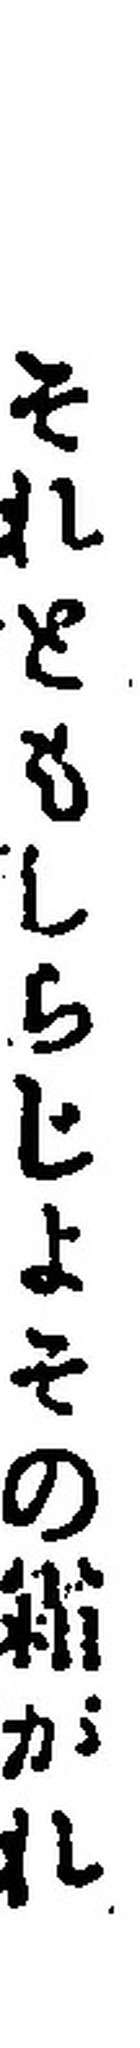それともしらじよその霜がれ
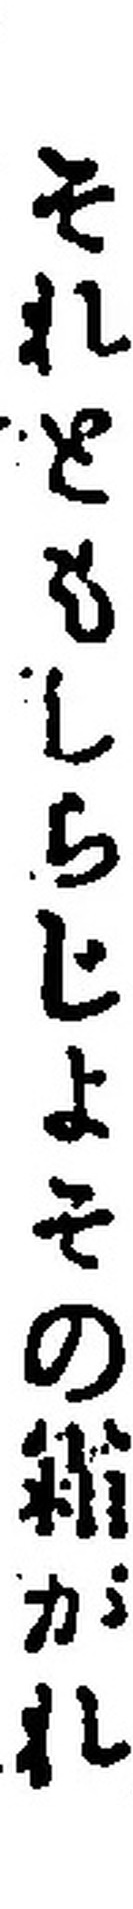それともしらじよその霜がれ
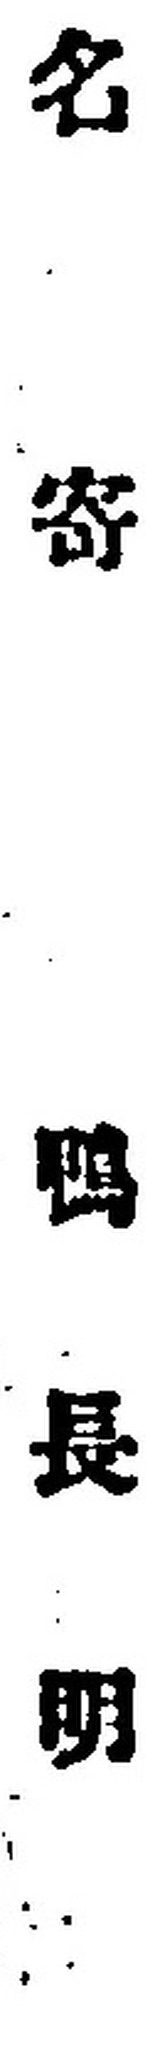名寄鴨長明
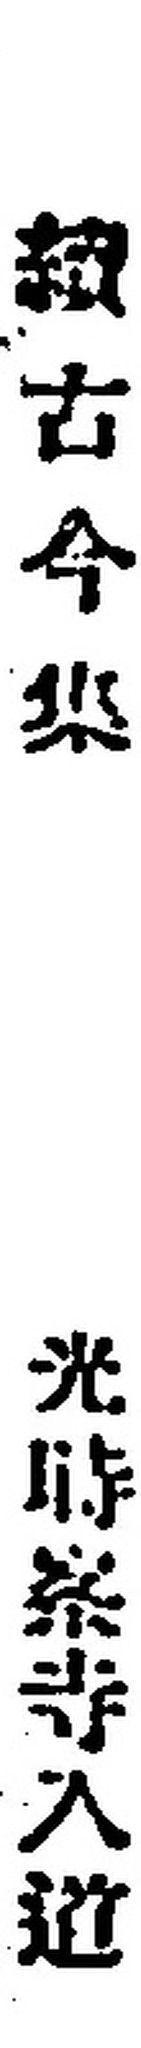続古今集光時峯寺入道
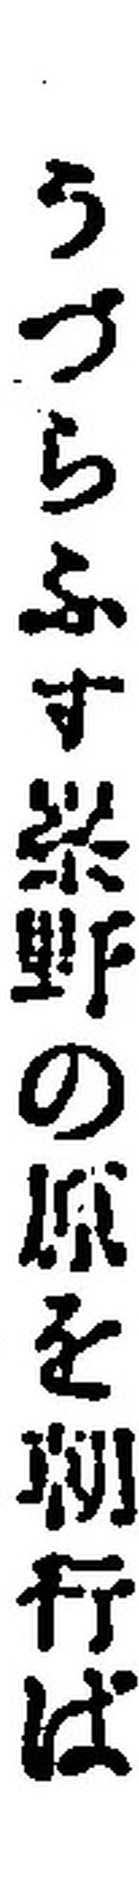うづらふす峯野の原を朝行ば
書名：東参名勝案内
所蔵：国立国会図書館 National Diet Library, JAPAN
